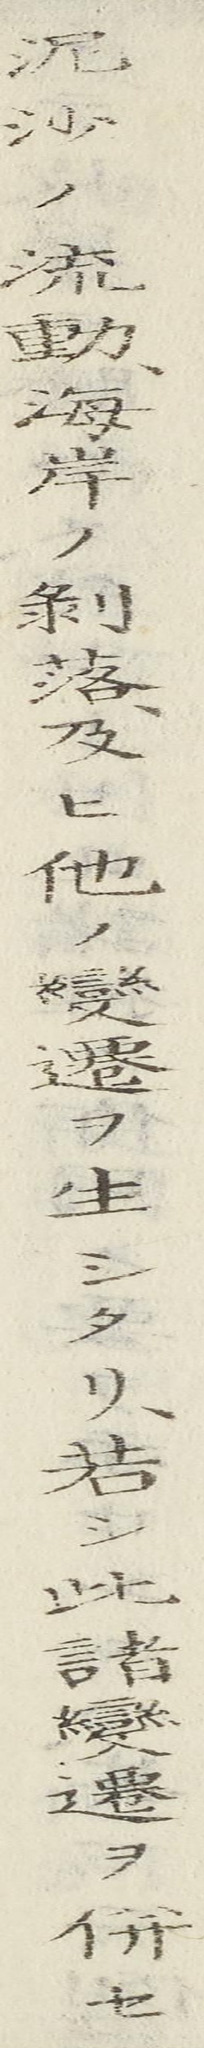泥沙ノ流動、海岸ノ剥落、及ヒ他ノ変遷ヲ生シタリ、若シ此諸変遷ヲ併セ
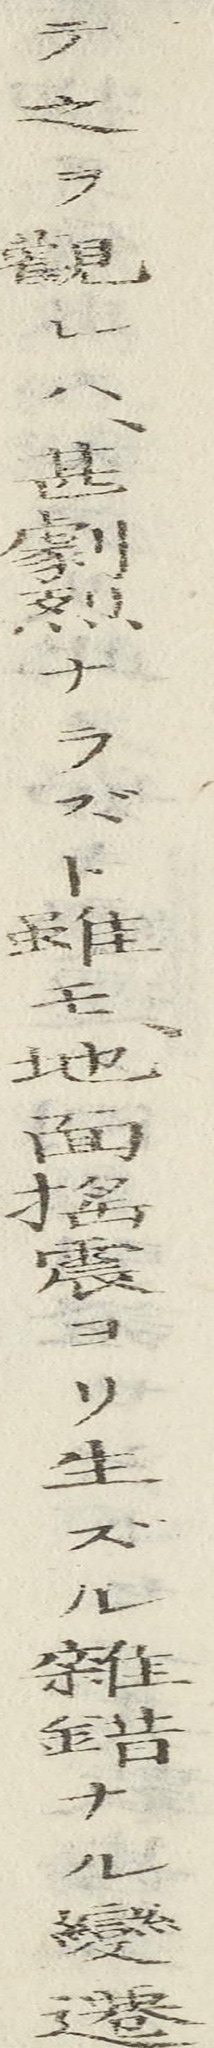テ之ヲ観レハ、甚劇烈ナラズト雖モ、地面揺震ヨリ生ズル雑錯ナル変遷
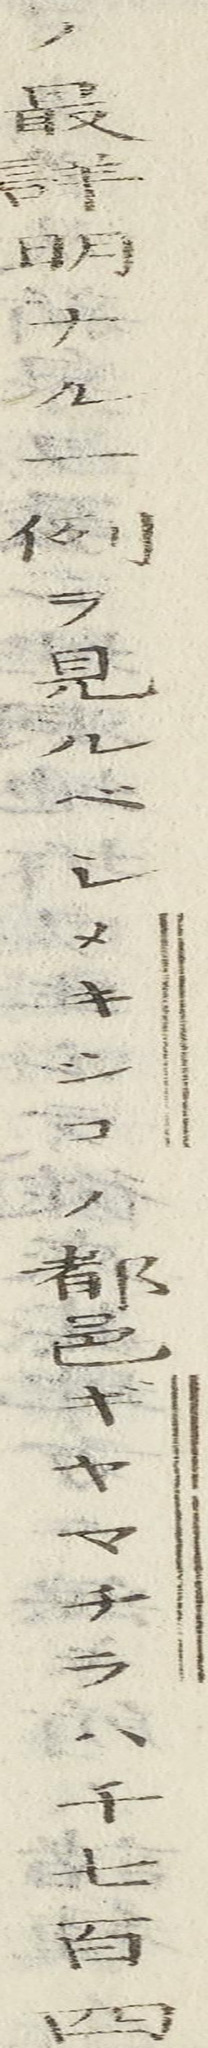ノ最詳明ナル一例ヲ見ルベシメキシコノ都邑ギヤマチラハ千七百四
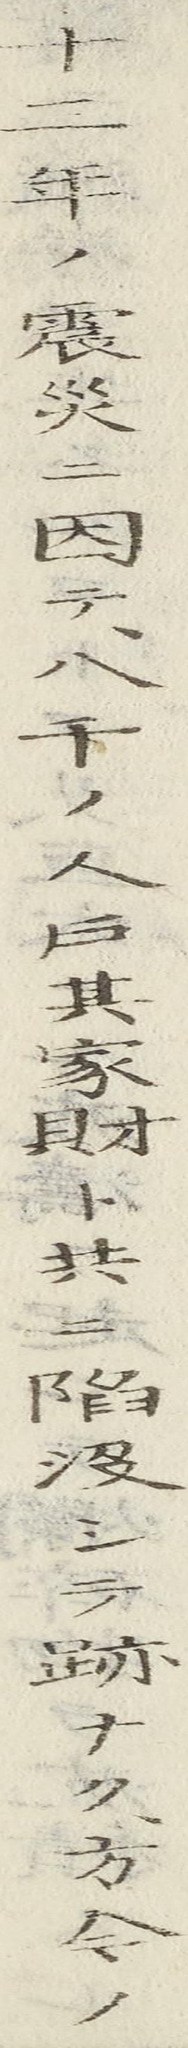十二年ノ震災ニ因テ、八千ノ人戸其家財ト共ニ陥没シテ跡ナク、方今ノ
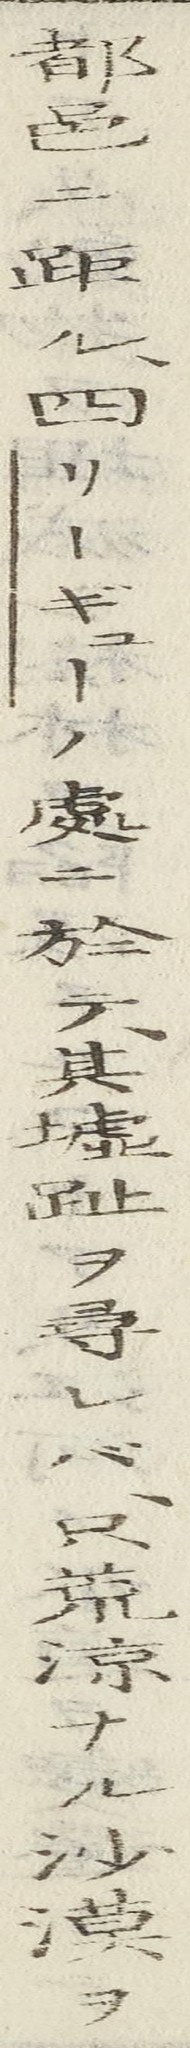都邑ニ距ル、四リーギューノ処ニ於テ、其墟阯ヲ尋レバ、只荒涼ナル沙漠ヲ
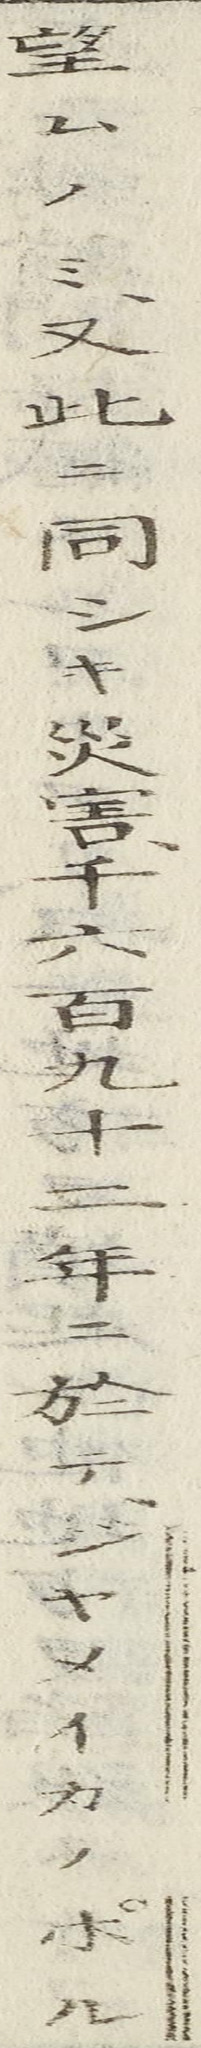望ムノミ、又此ニ同シキ災害、千六百九十二年ニ於テ、ジヤメイカノポル
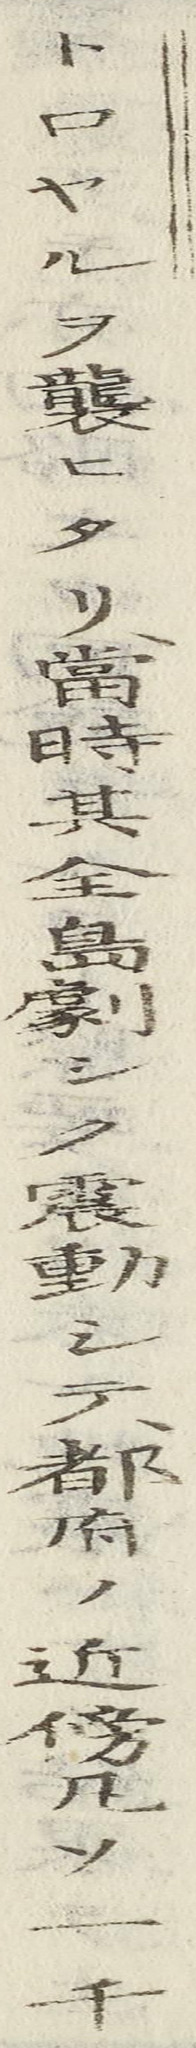トロイヤルヲ襲ヒタリ、当時其全島劇シク震動シテ、都府ノ近傍凡ソ一千
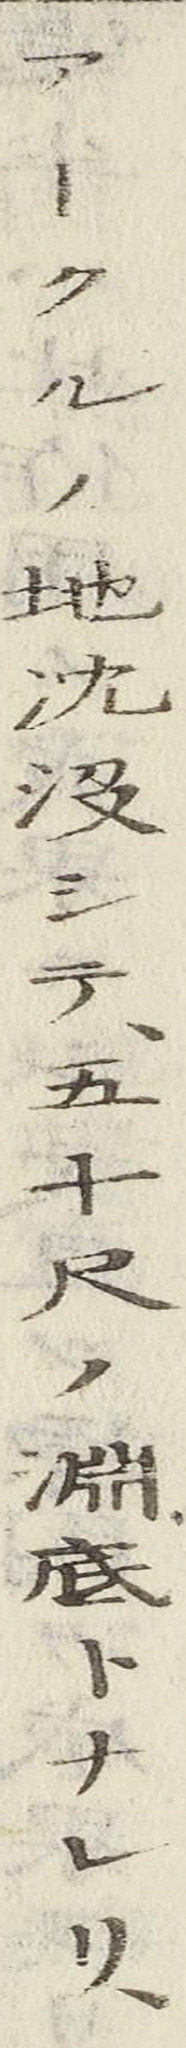アークルノ地沈没シテ、五十尺ノ淵底トナレリ、
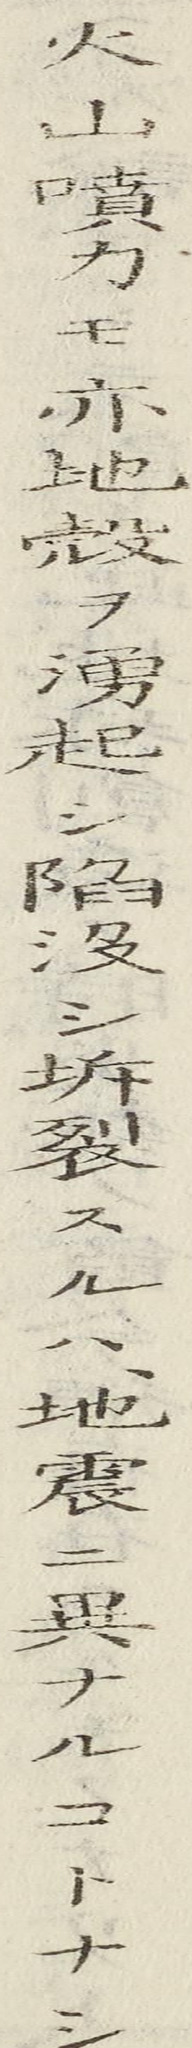火山噴力モ亦地殻ヲ湧起シ陥没シ坼裂スルハ、地震ニ異ナルコトナシ、
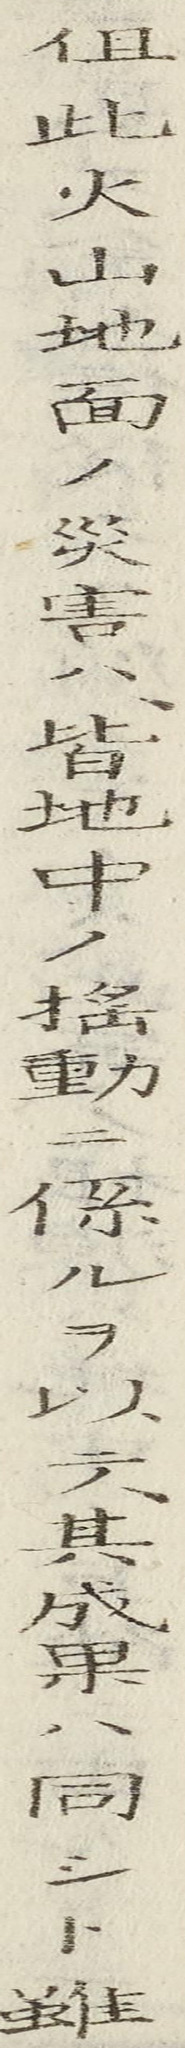但此火山地面ノ災害ハ、皆地中ノ揺動ニ係ルヲ以テ、其成果ハ同シト雖
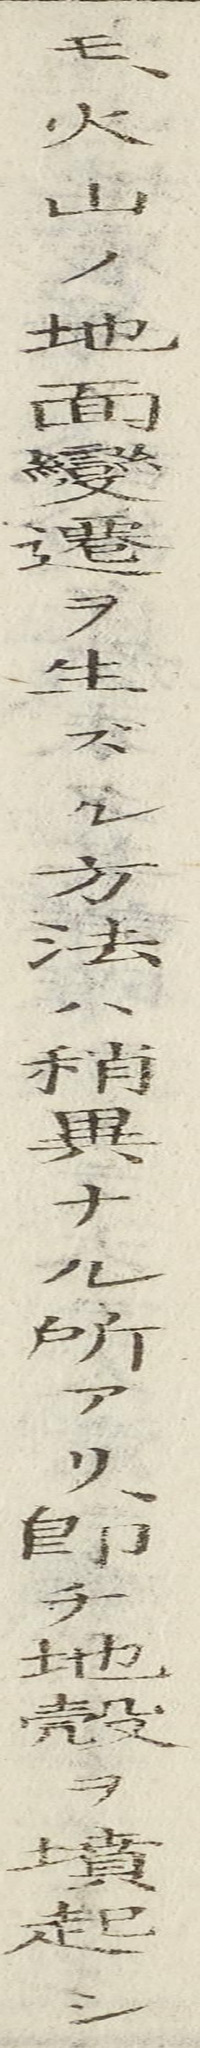モ、火山ノ地面変遷ヲ生ズル方法ハ稍異ナル所アリ、即チ地殻ヲ墳起シ
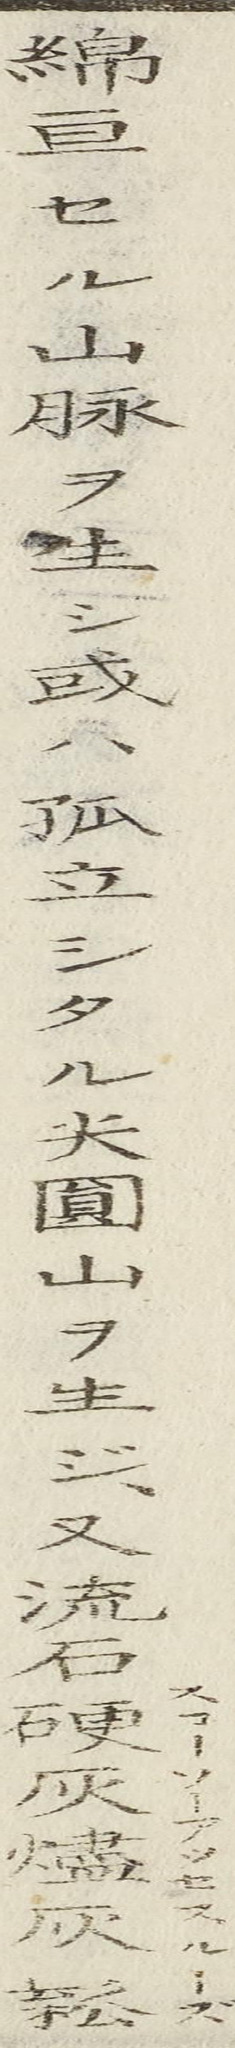綿亘セル山脉ヲ生シ或ハ孤立シタル尖円山ヲ生ジ、又流石硬灰燼灰鬆
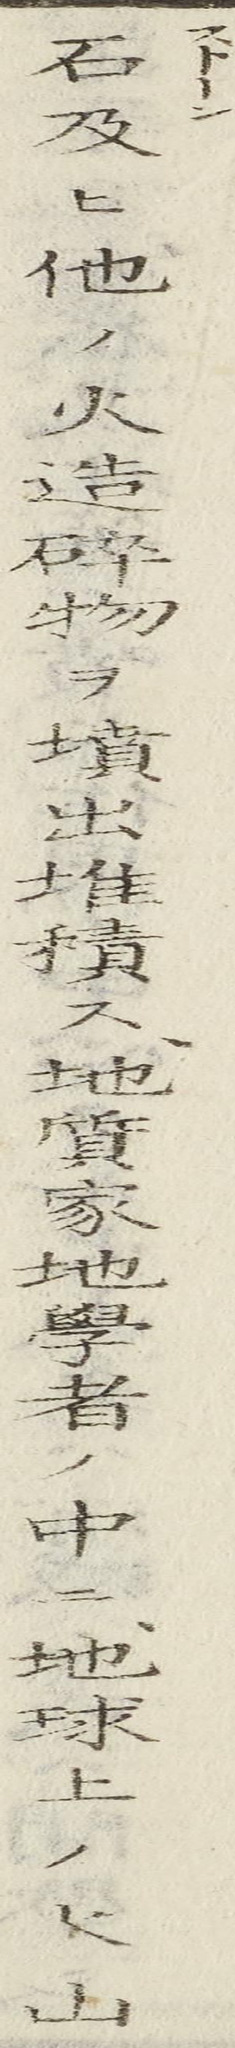石及ヒ他ノ火造砕物ヲ噴出堆積ス、地質家地学者ノ中ニ、地球上ノ火山
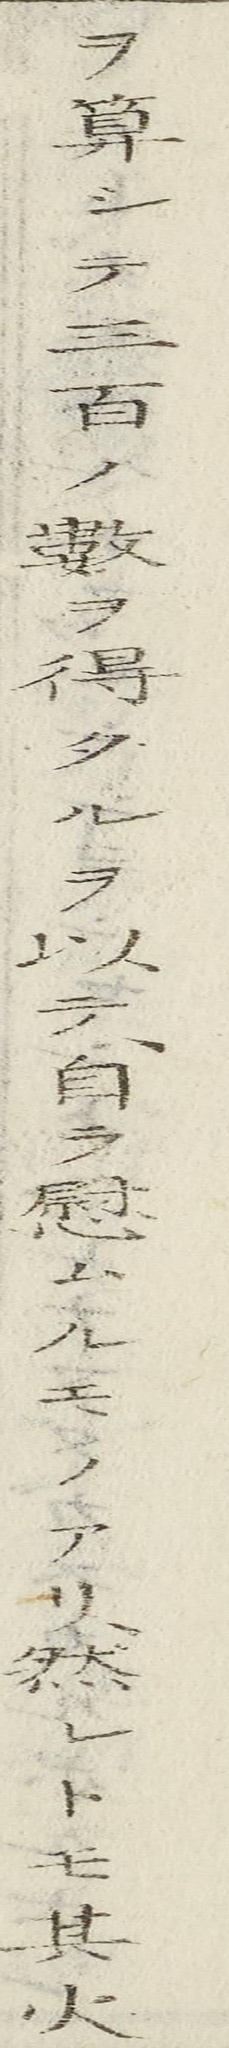ヲ算シテ三百ノ数ヲ得タルヲ以テ、自ラ慰ムルモノアリ、然レトモ其火
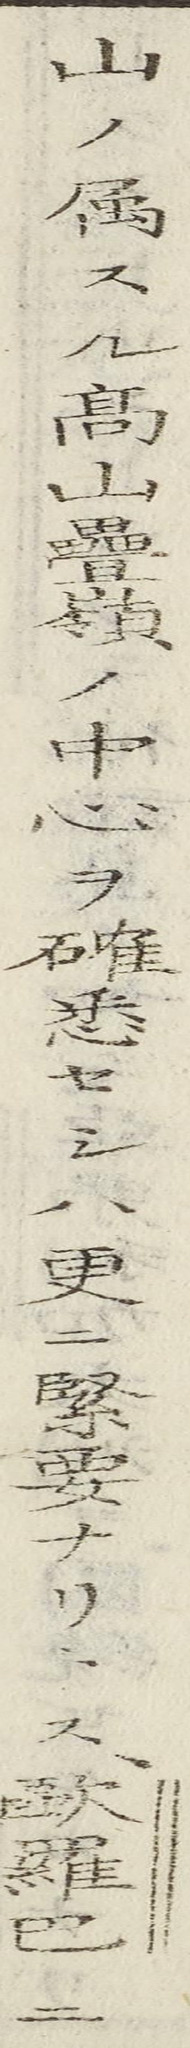山ノ属スル高山畳嶺ノ中心ヲ確悉セシハ更ニ緊要ナリトス、欧羅巴ニ
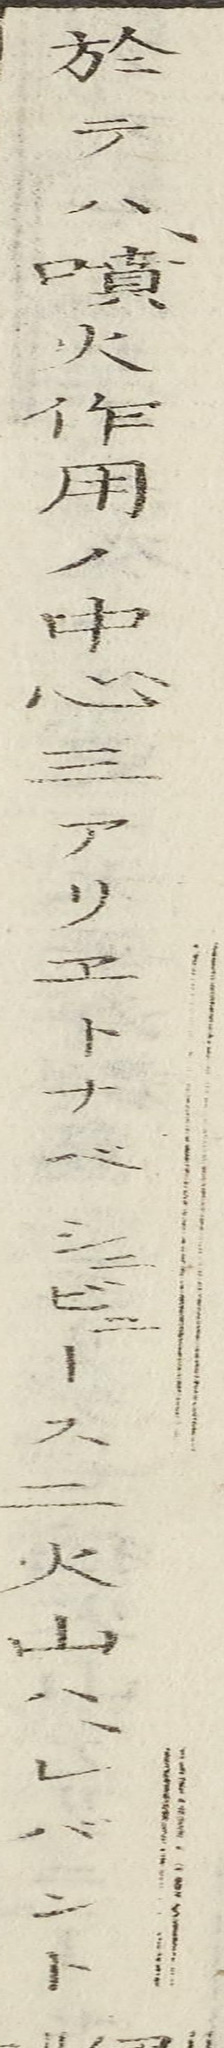於テハ、噴火作用ノ中心三アリエトナベシュビュース二火山ハ、レバント伊太
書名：百科全書　地文學　全
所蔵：東京大学地震研究所図書室 Earthquake Research Institute Library, The University of Tokyo, JAPAN
